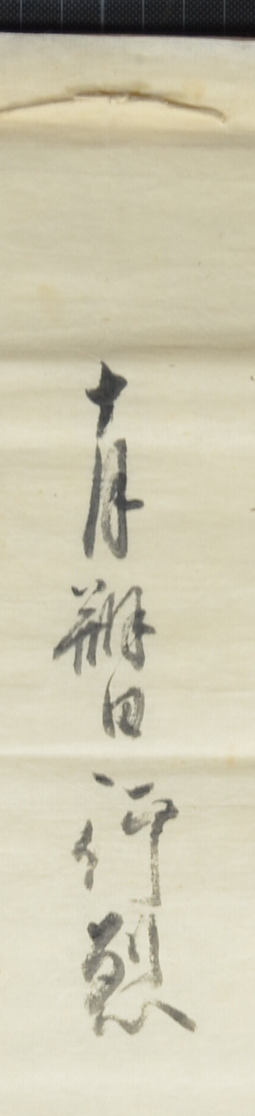十月朔日行列
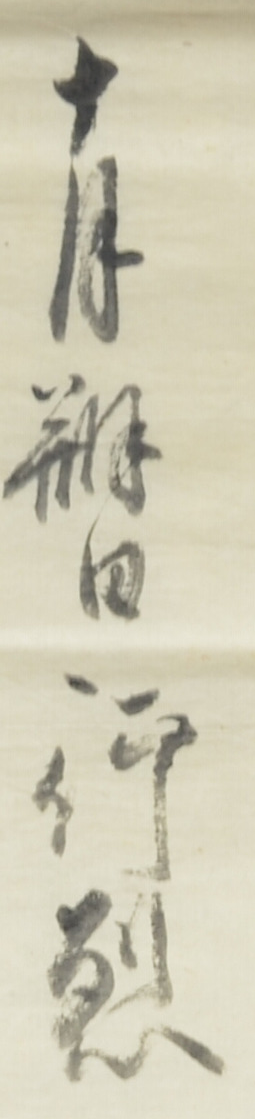十月朔日行列
